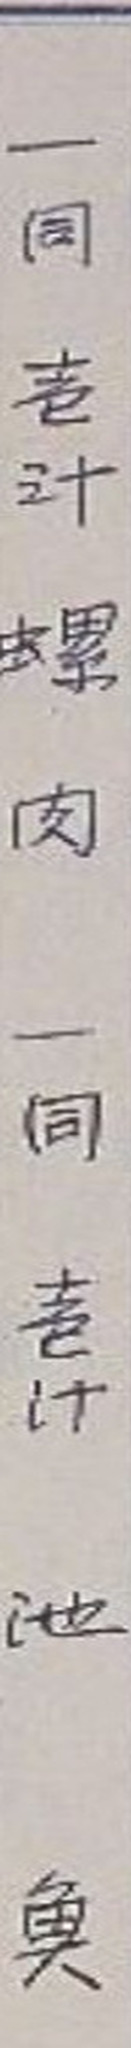一同壱汁螺肉一同壱汁池魚
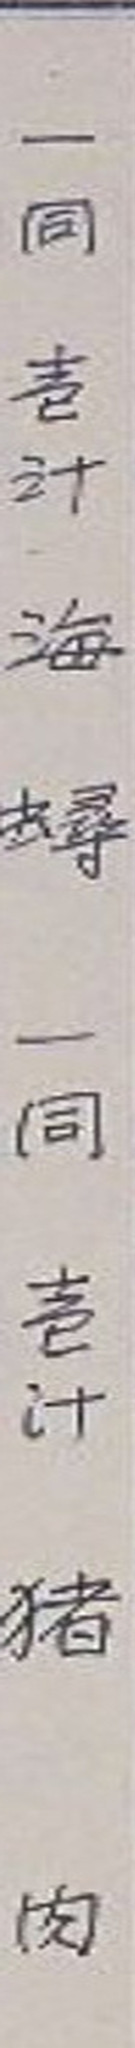一同壱汁海蟳一同壱汁猪肉
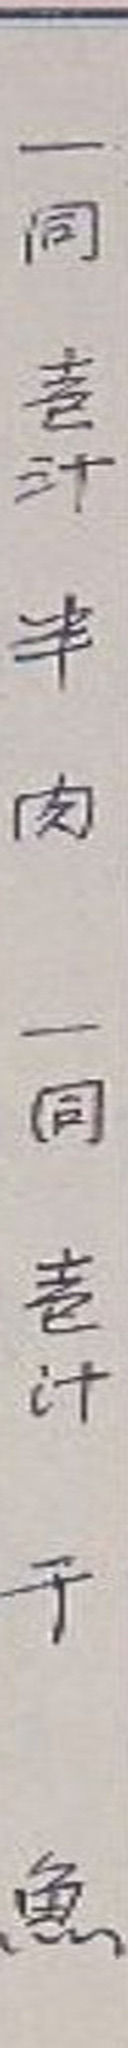一同壱汁半肉一同壱汁干魚
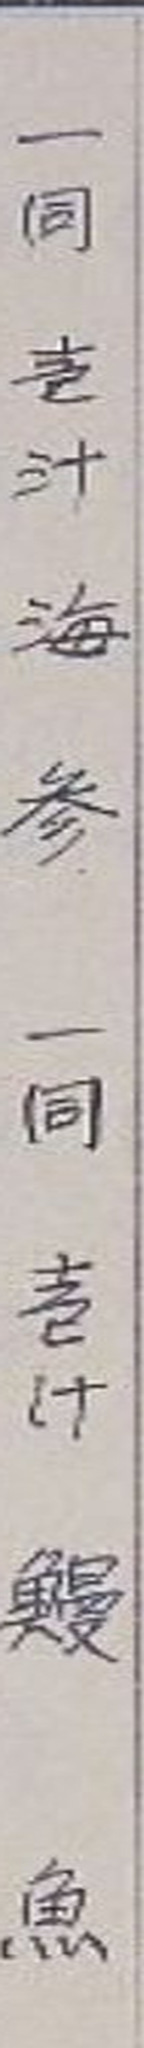一同壱汁海参一同壱汁鰻魚
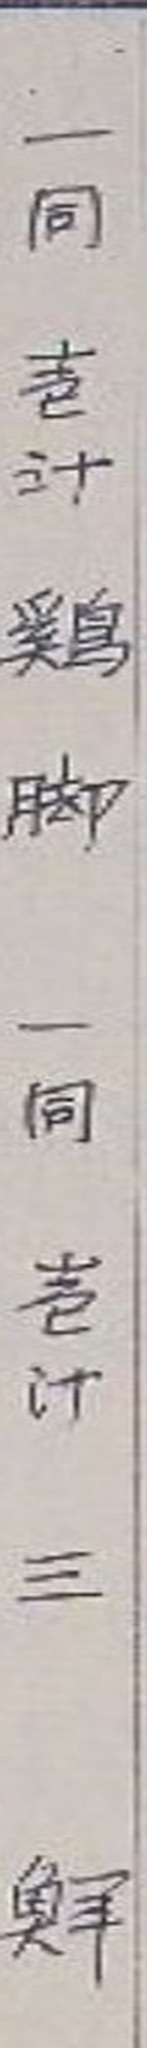一同壱汁鶏脚一同壱汁三鮮
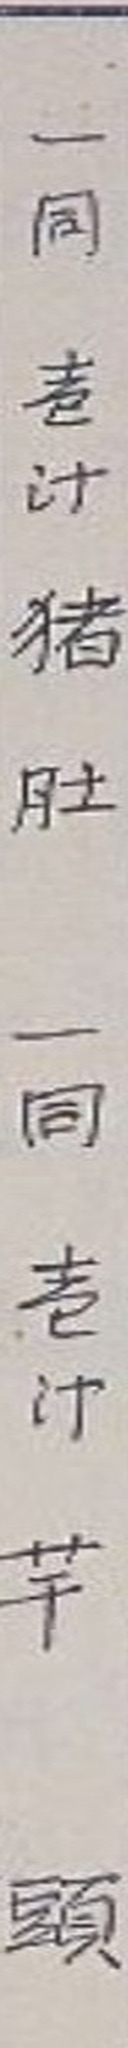一同壱汁猪肚一同壱汁芋頭
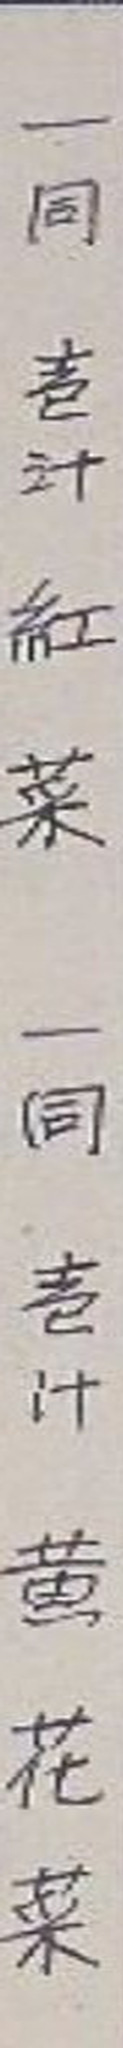一同壱汁紅菜一同壱汁黄花菜
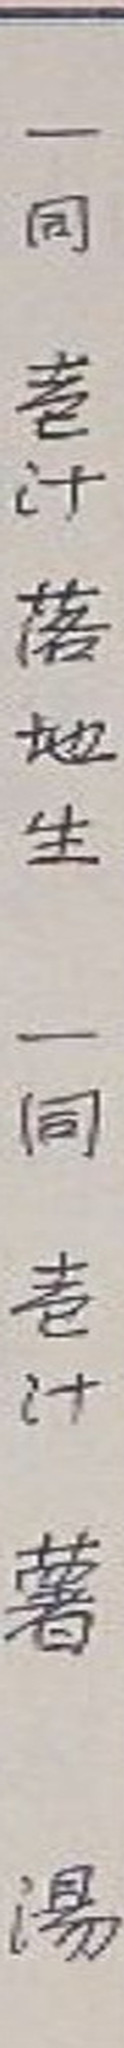一同壱汁落地生一同壱汁薯湯
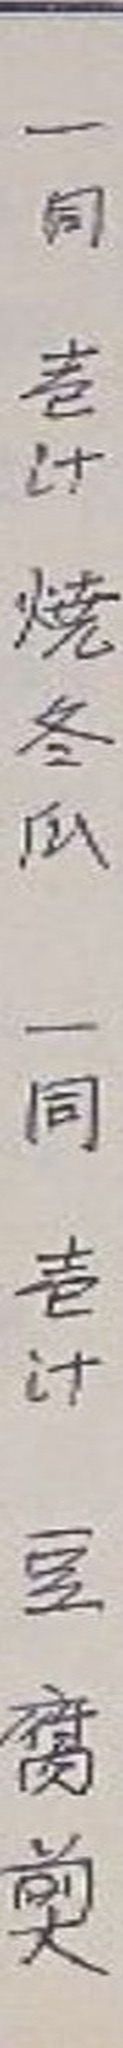一同壱汁焼冬瓜一同壱汁豆腐煎
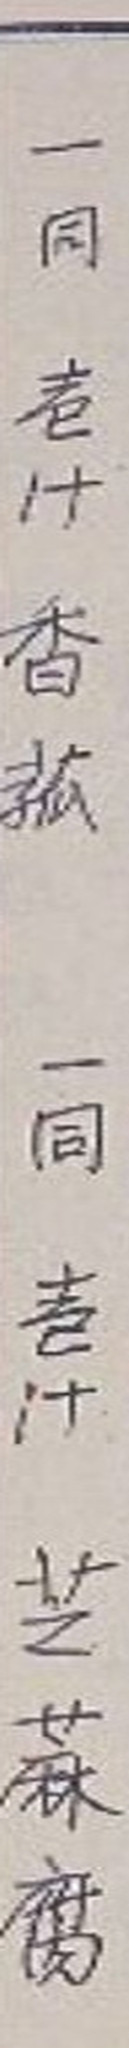一同壱汁香菰一同壱汁芝蔴腐
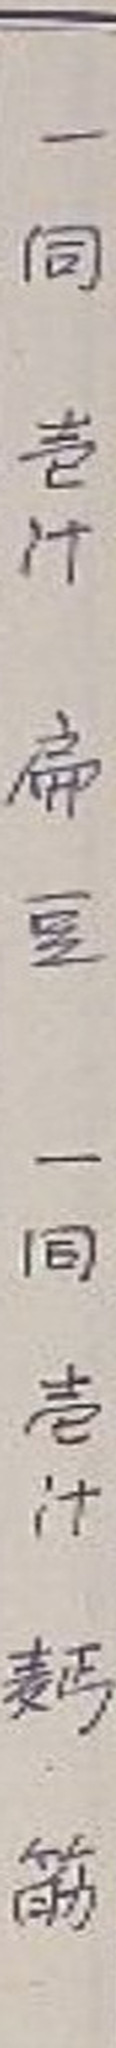一同壱汁扁豆一同壱汁麪筋
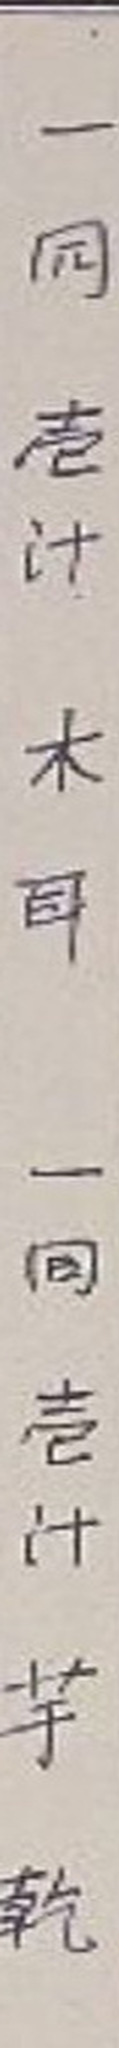一同壱汁木耳一同壱汁芋乾
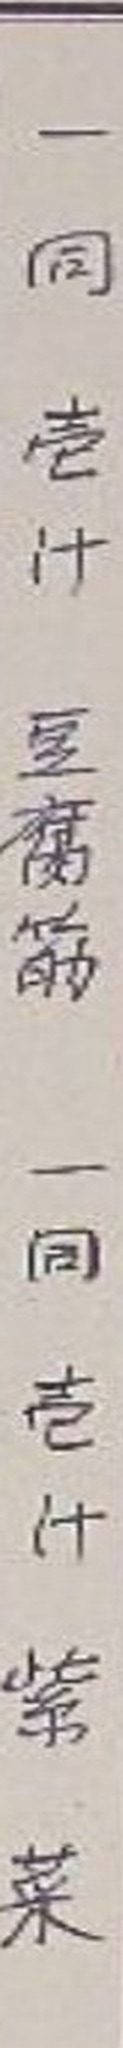一同壱汁豆腐筋一同壱汁紫菜
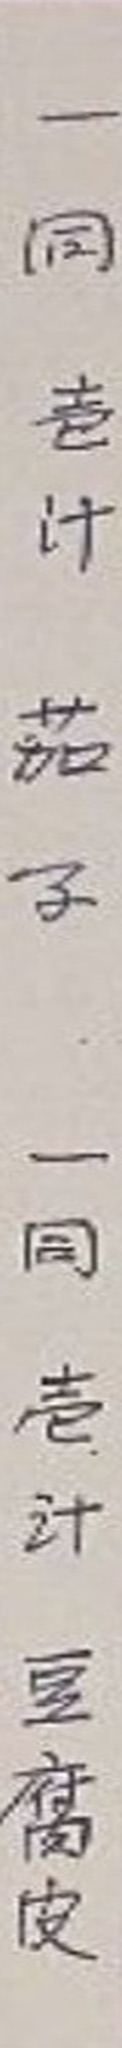一同壱汁茄子一同壱汁豆腐皮
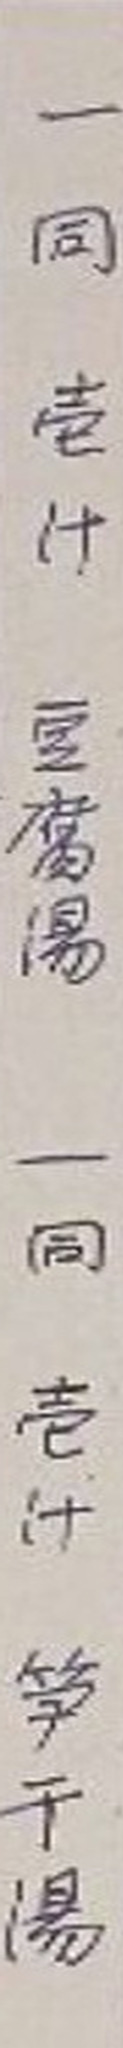一同壱汁豆腐湯一同壱汁笋干湯
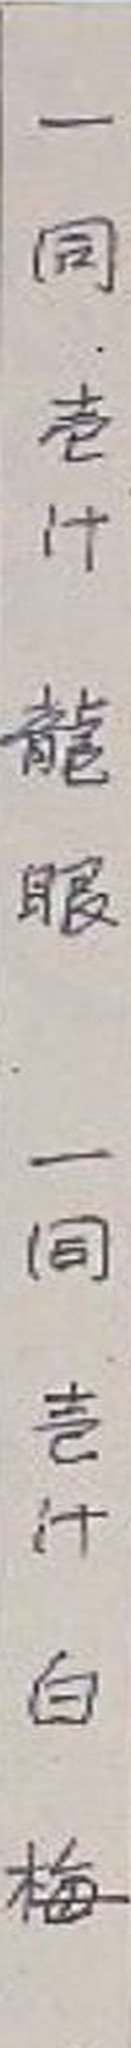一同壱汁龍眼一同壱汁白梅
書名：支那冊封使来琉諸記 下巻
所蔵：University of the Ryukyus Library
